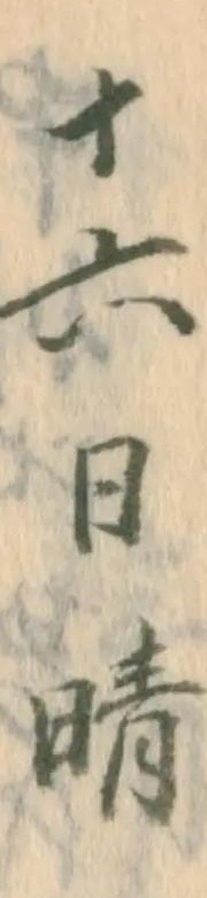十六日晴
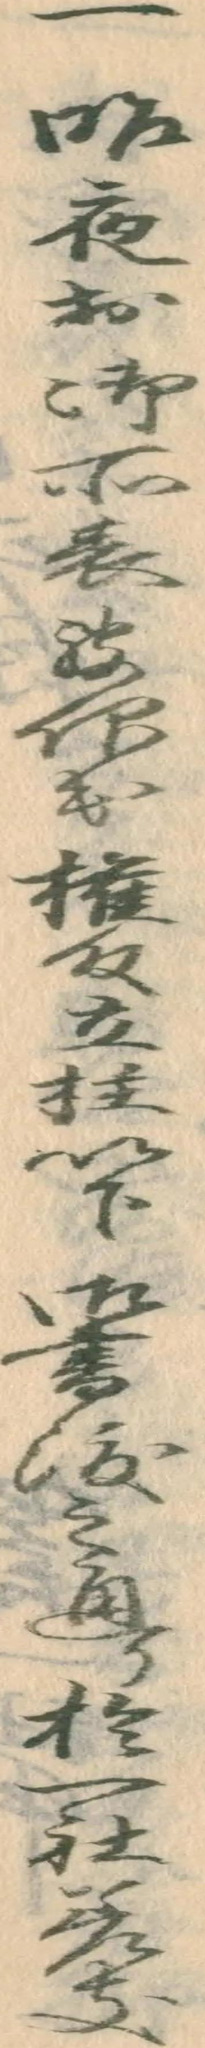一昨夜於御所表被仰出権殿立柱以下御書渡之通り於一社差支
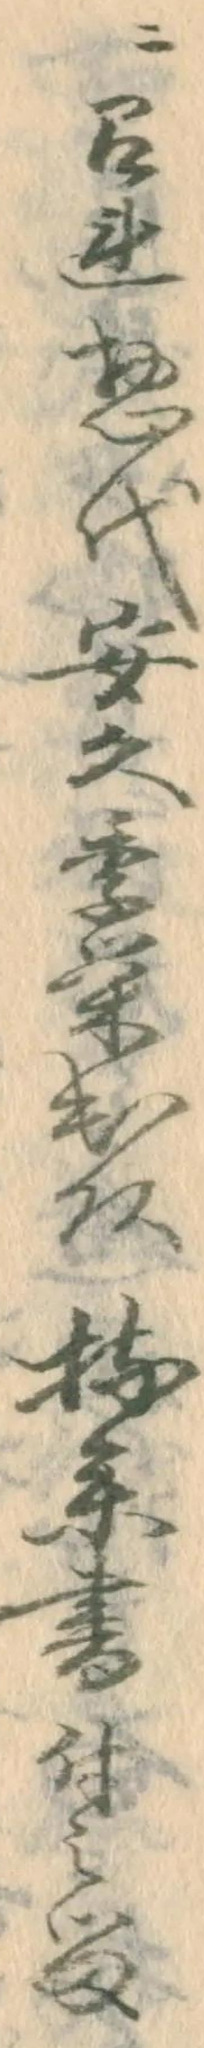ニ召連惣代安久季栄出頭持参書付之留
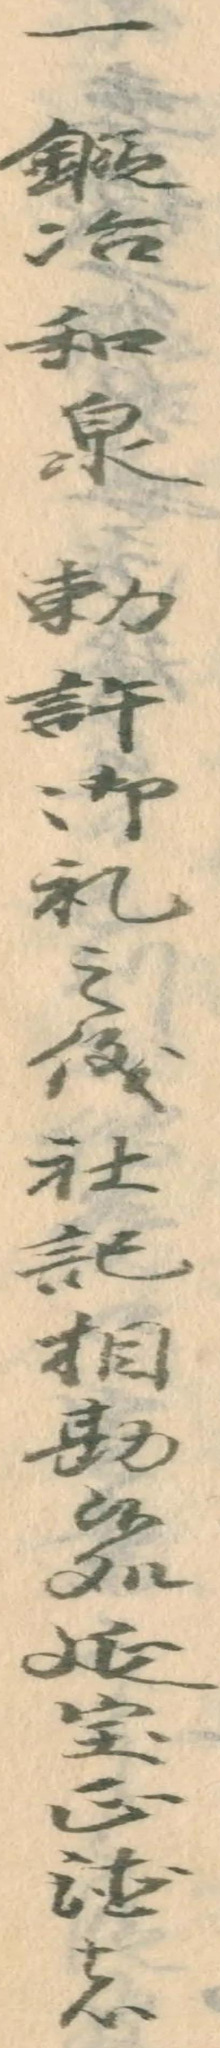一鍛冶和泉勅許御礼之儀社記相勤候処延宝正徳は

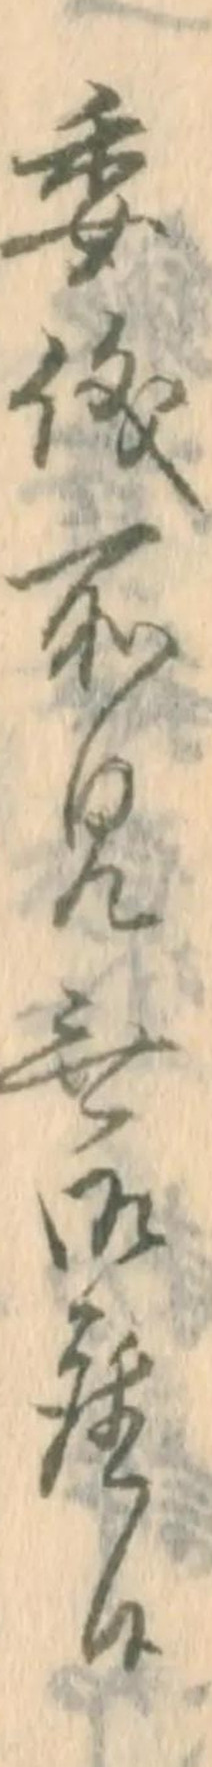委儀所見無御座候
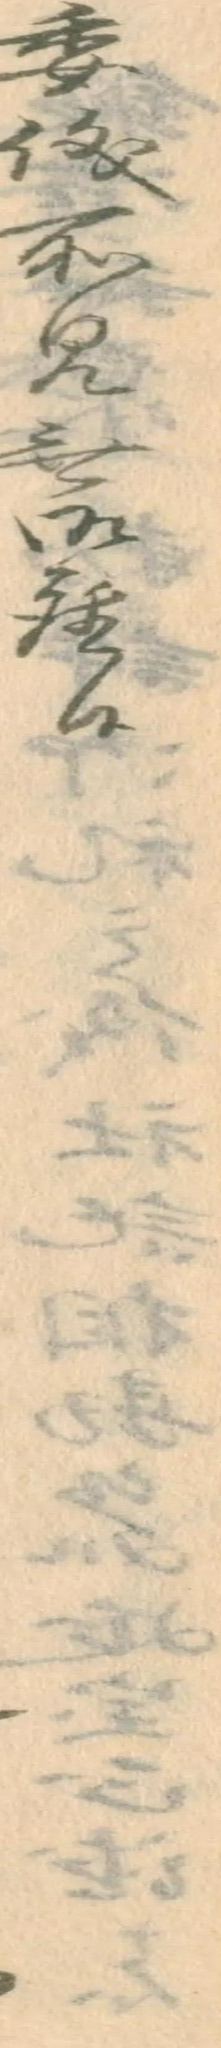委儀所見無御座候
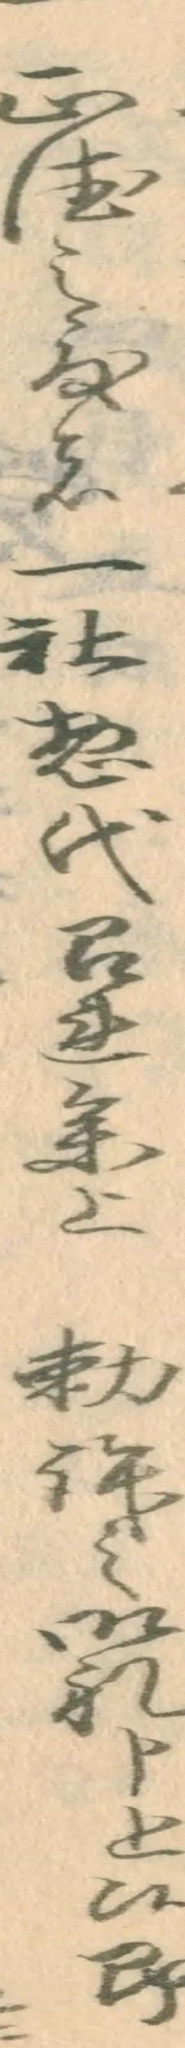一正徳之度は一社惣代召連参上勅許之御礼申上候即
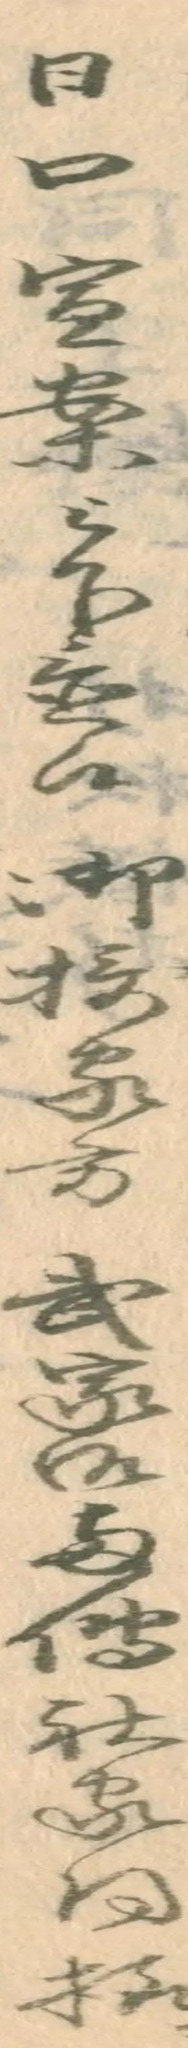日口宣案被下置候御摂家方武家御両伝社家同様ニ
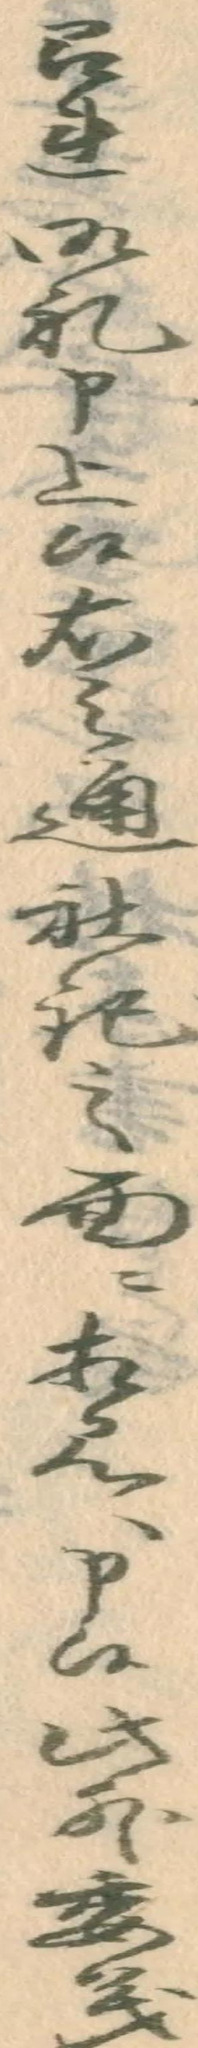召連御礼申上候右之通社記之面ニ相見へ申候此外委義
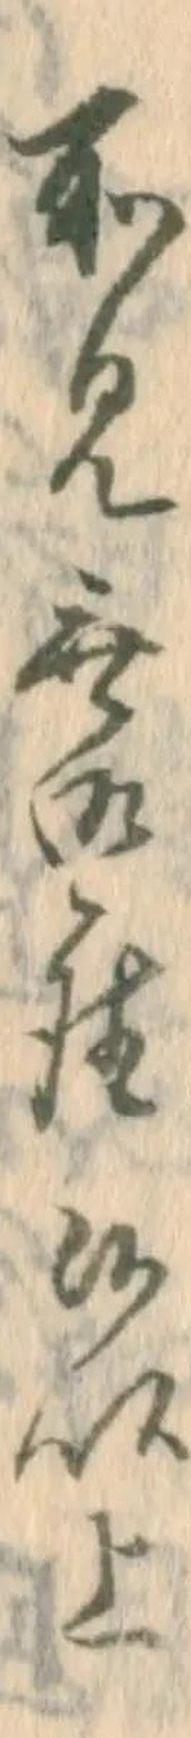所見無御座候以上
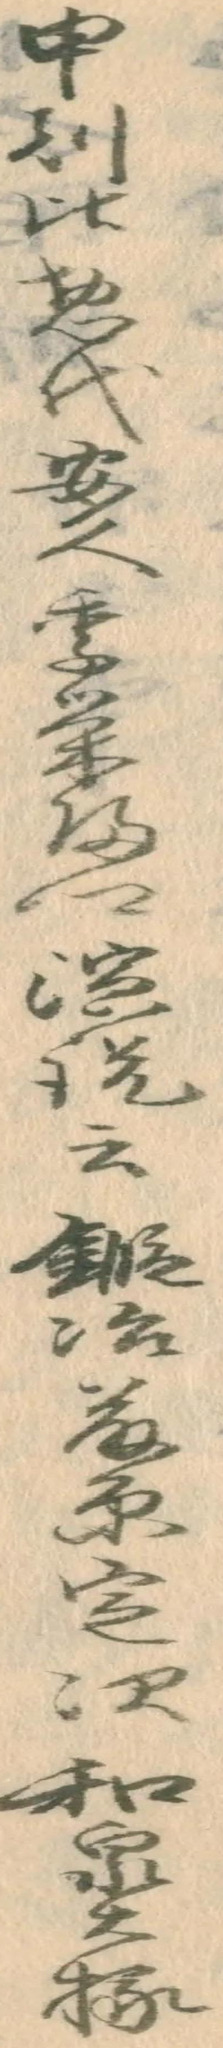申刻比惣代安久季栄帰郷演説云鍛冶藤原定次和泉大掾
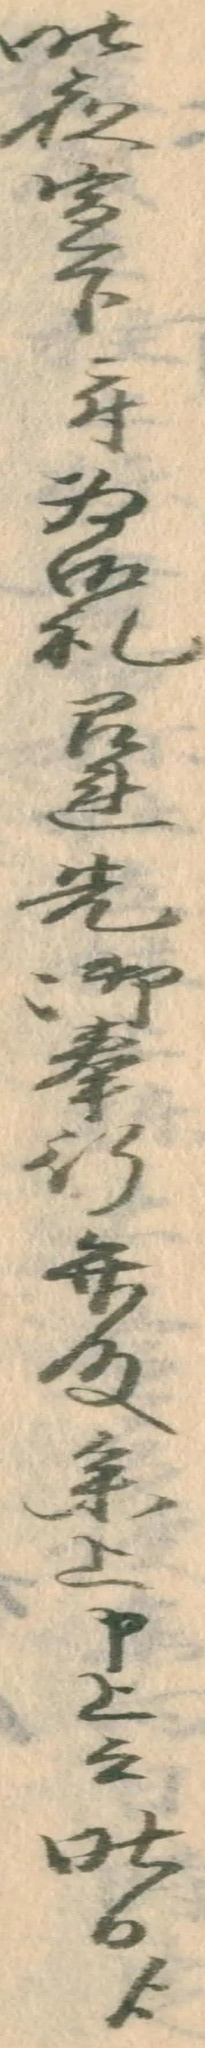昨夜宣下ニ付為御礼召連先御奉行弁殿参上申上云昨日ゟ
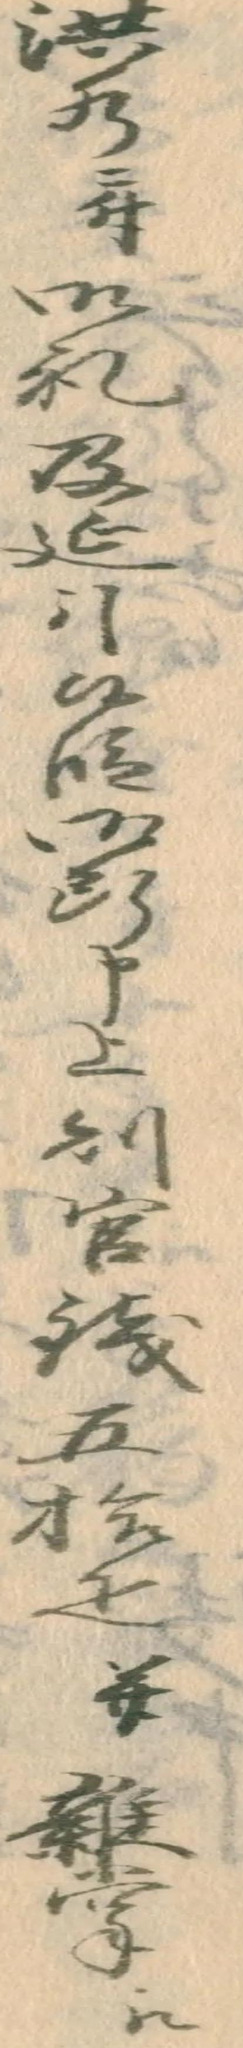洪水ニ付御礼及延引候段御断申上則官銭五拾疋并雑掌江
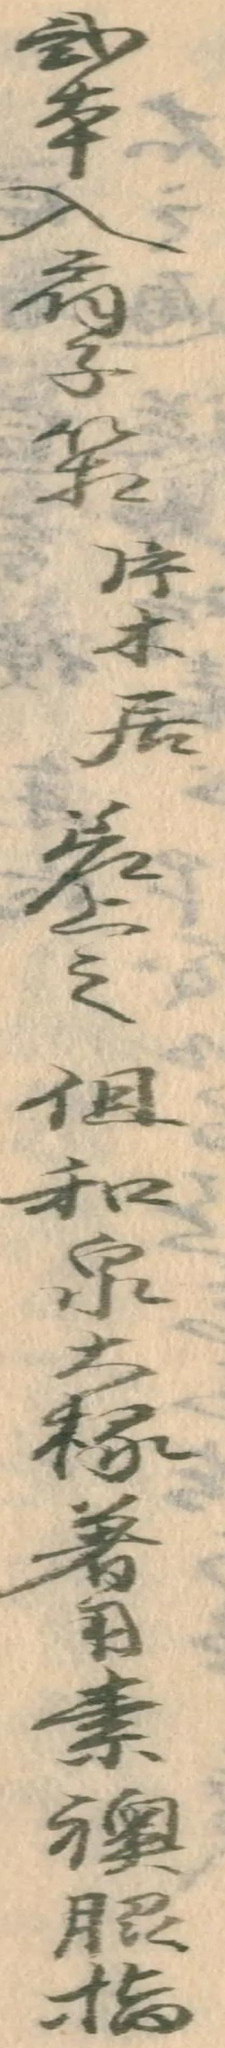弐本入扇子箱片木居差上之但和泉大掾着用素襖脇指
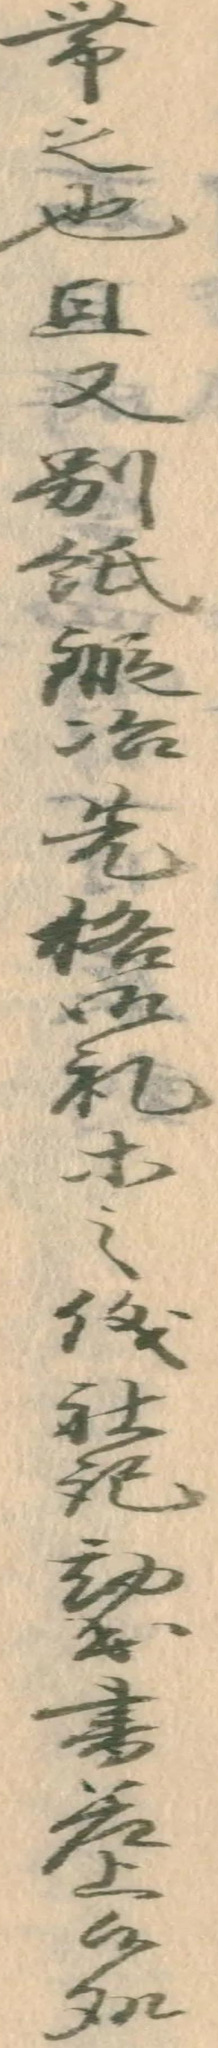帯之也且又別紙鍛冶先格御礼等之儀社記勘出書差上候処
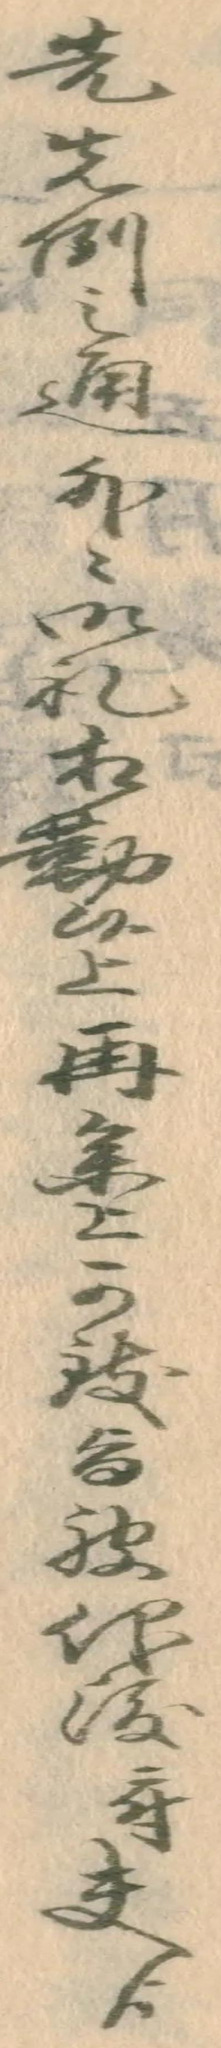先先例之通外々御礼相勤候上再参上可致旨被仰渡ニ付夫ゟ
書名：賀茂社記録. 第17冊
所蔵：国立国会図書館 National Diet Library, JAPAN
